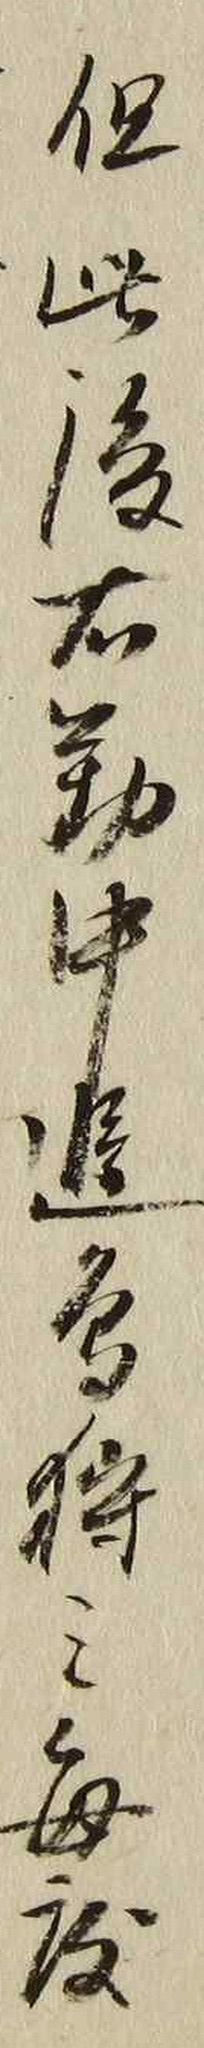但此後右勤中追鳥狩之毎度
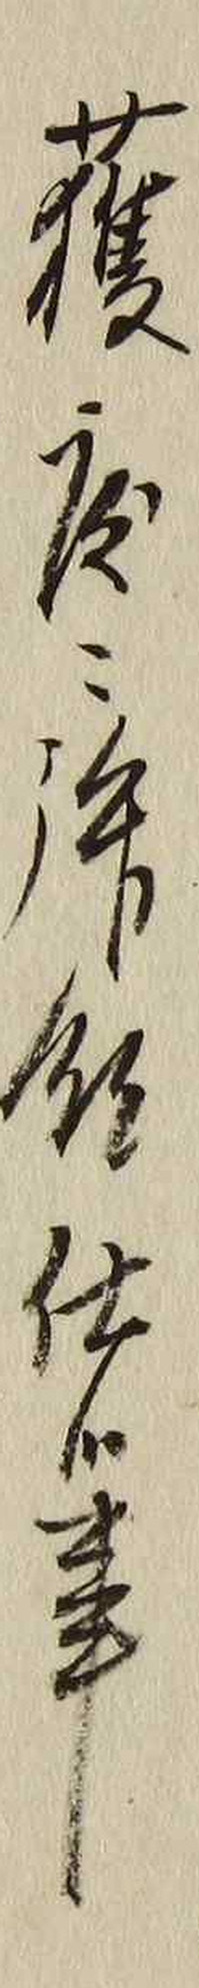獲度々拝領仕候事
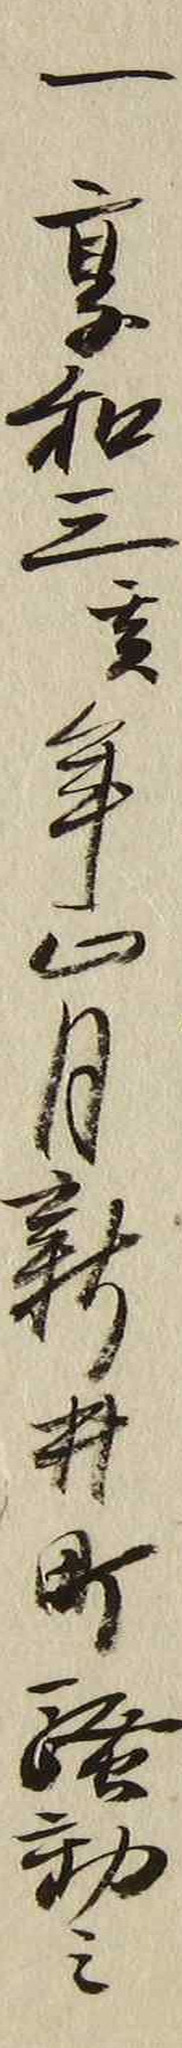一享和三亥年正月新井町騒動之
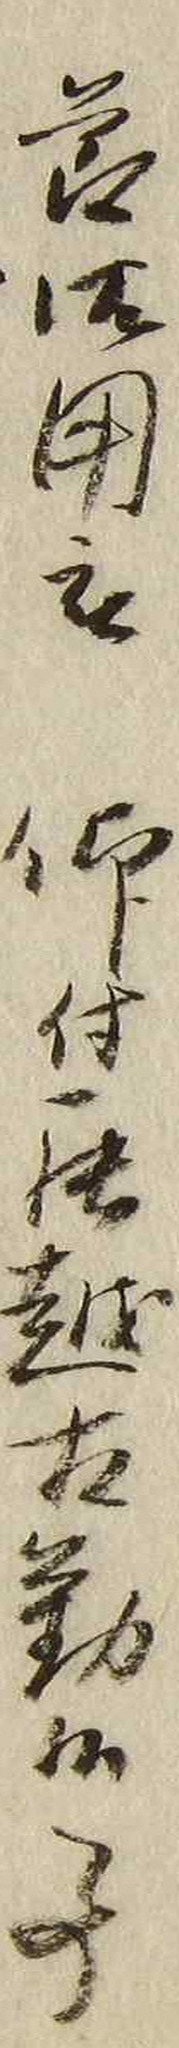節御用被仰付罷越相勤候事
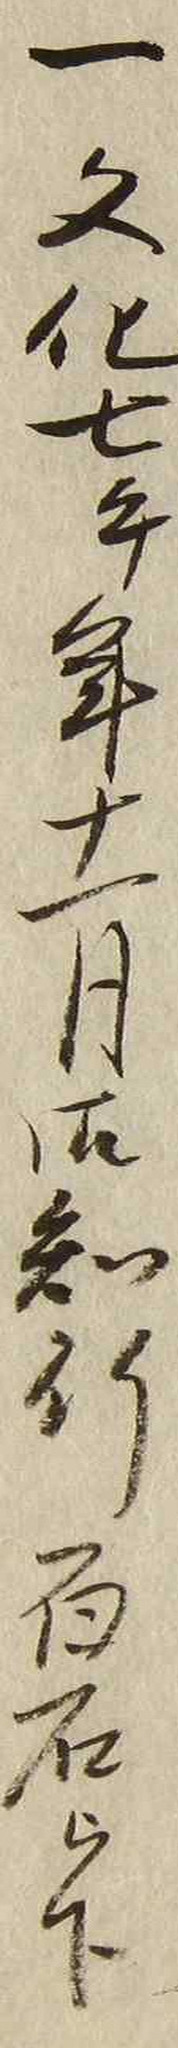一文化七午年十一月御知行百石被下

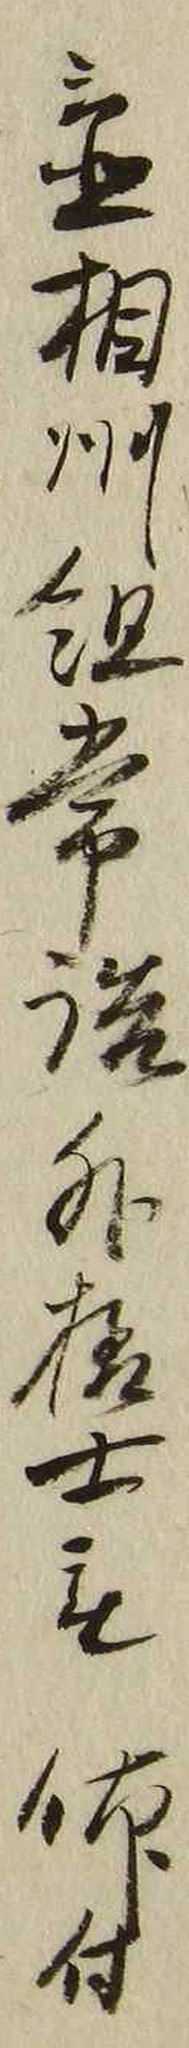置相州組常詰外様士被仰付
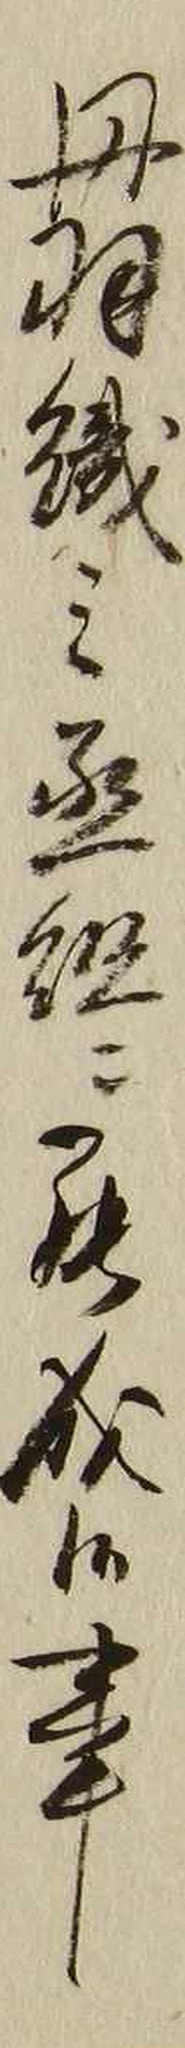丹羽織之丞組罷成候事
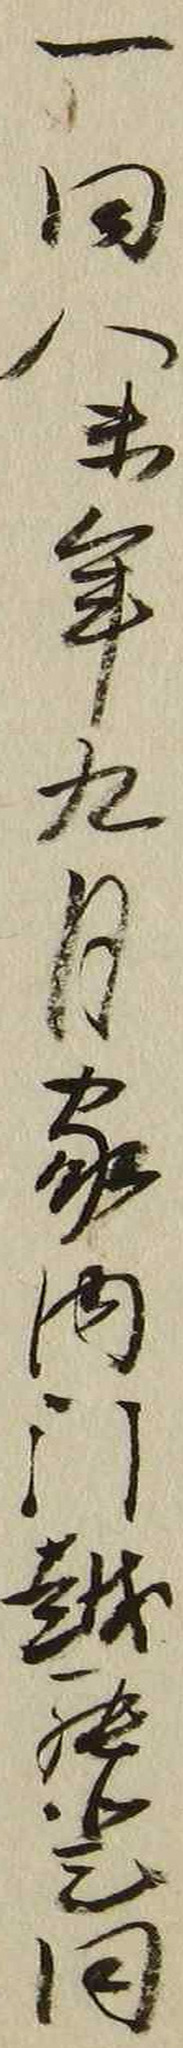一同八未年九月家内引越罷登同
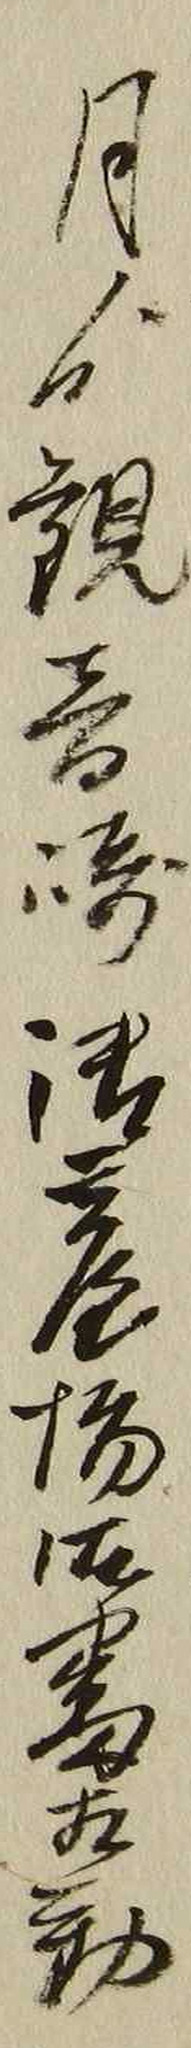月ゟ観音崎御台場御番相勤
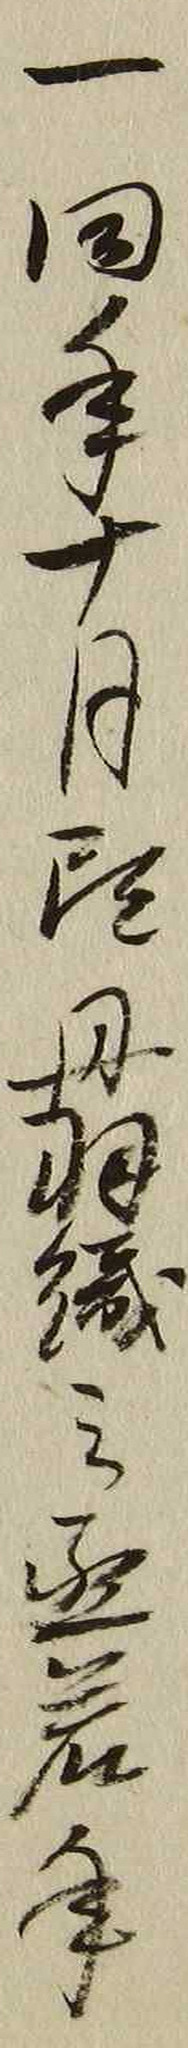一同年十月頭丹羽織之丞若年
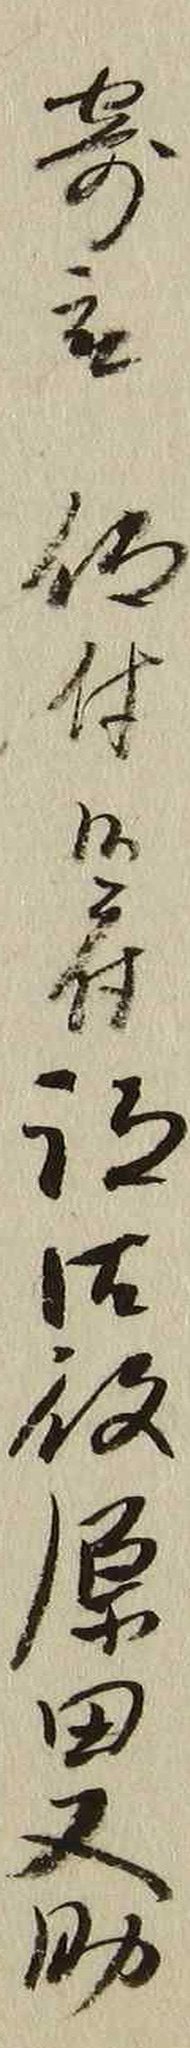寄被仰付候付跡御役原田又助
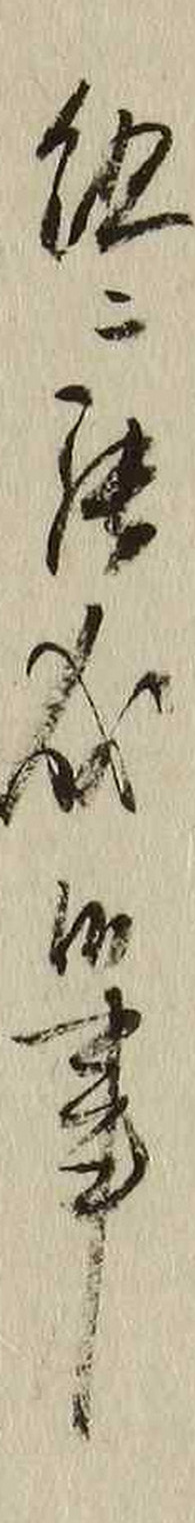組罷成候事
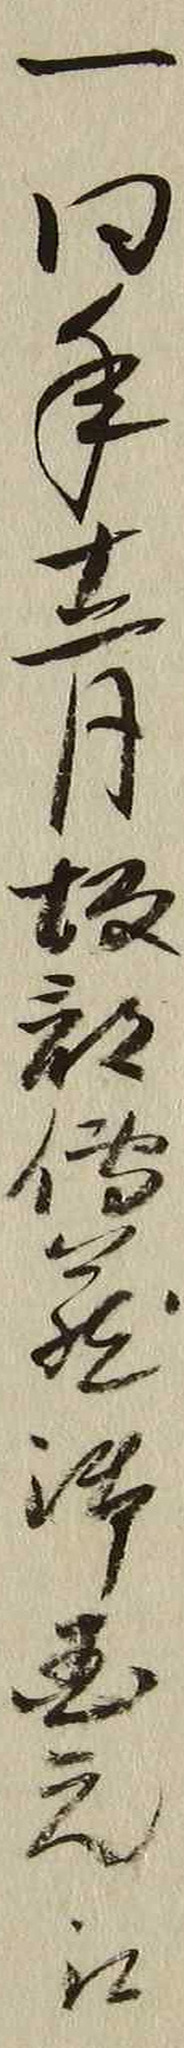一同年十二月坂部伝蔵御国元江
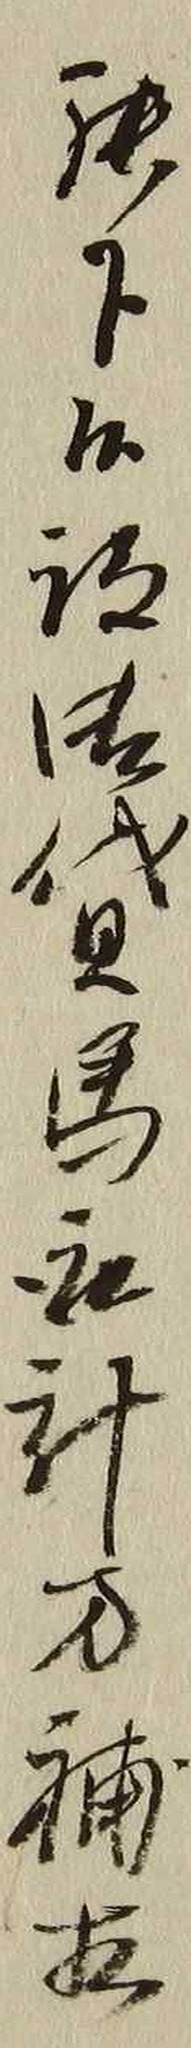罷下候跡御貸馬取計方補相
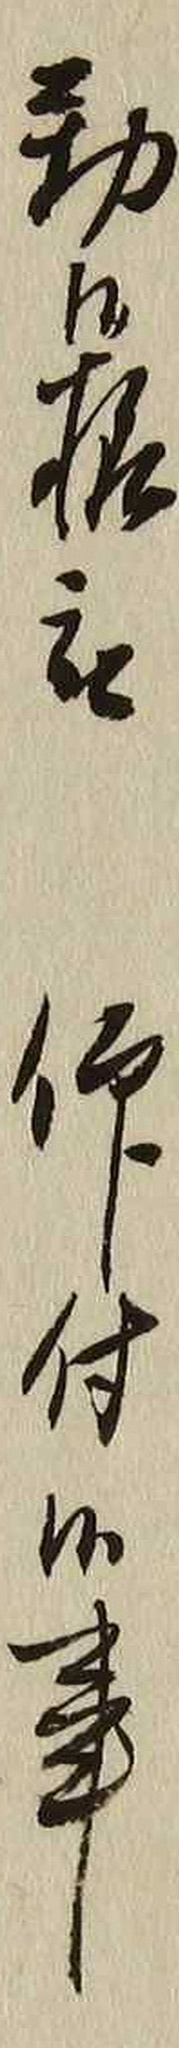勤候様被仰付候事
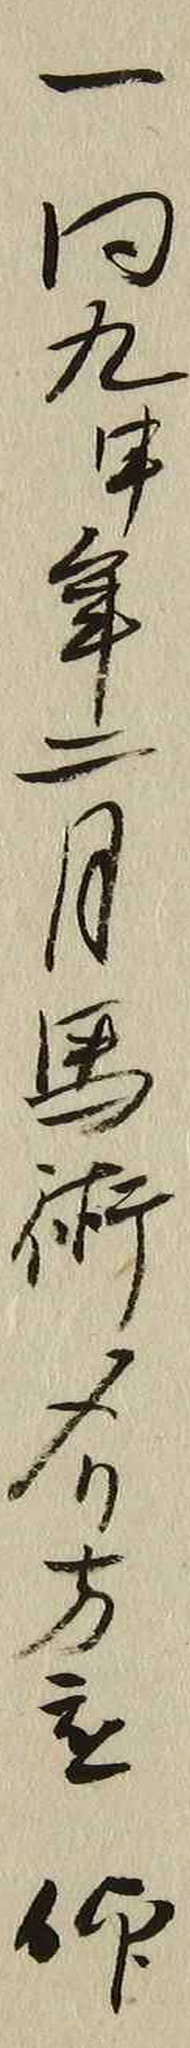一同九申年二月馬術〆り方被仰
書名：諸士系譜　巻之350　せ之部1冊全
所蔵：会津若松市立会津図書館
